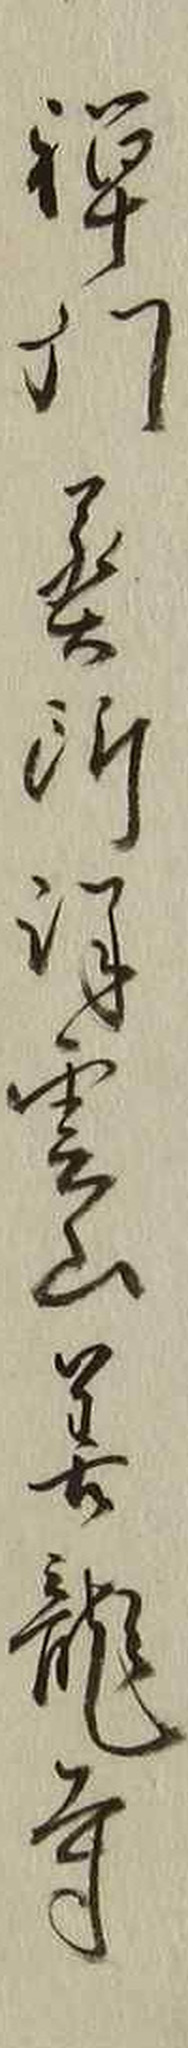禅門葬所詳雲山善龍寺
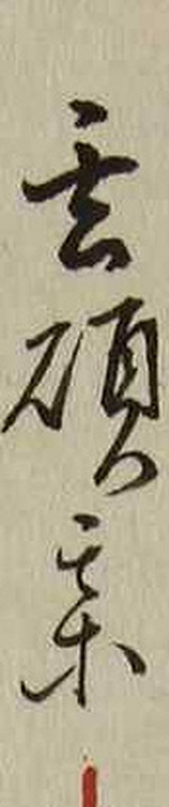玄碩某
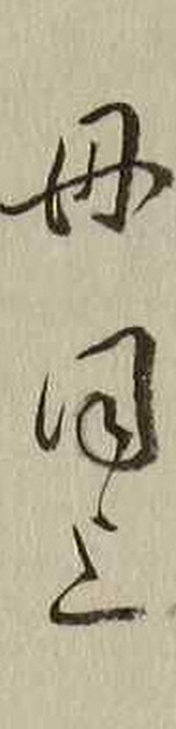母同上
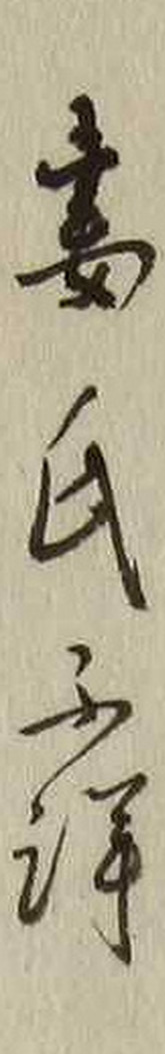妻氏不詳
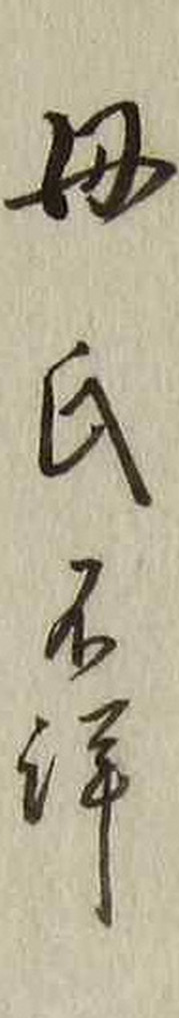母氏不詳
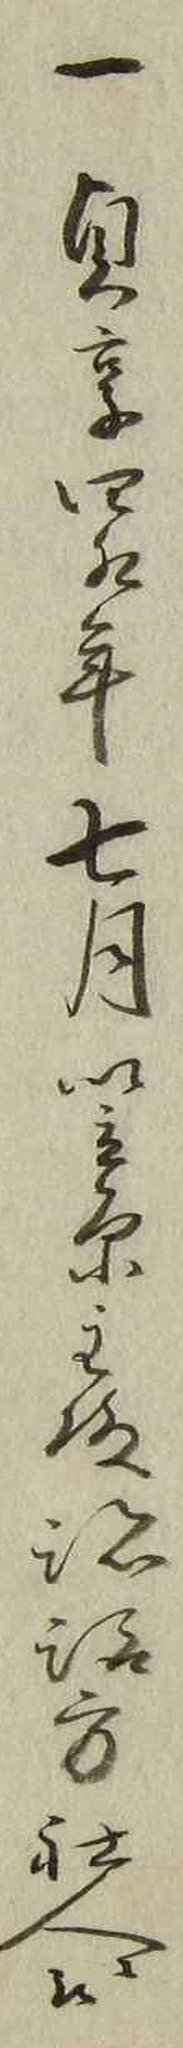一貞享四卯年七月笠原主殿諸諏方社人に被
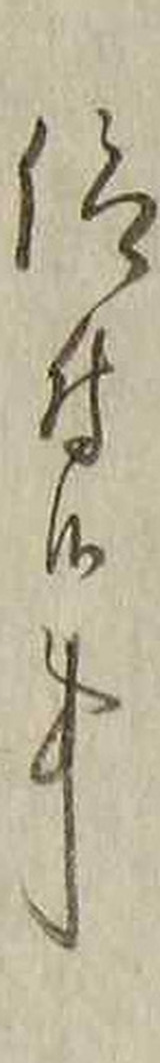仰付候事

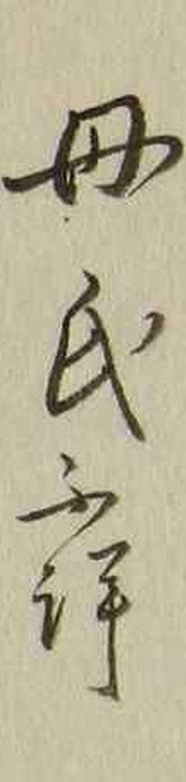母氏不詳
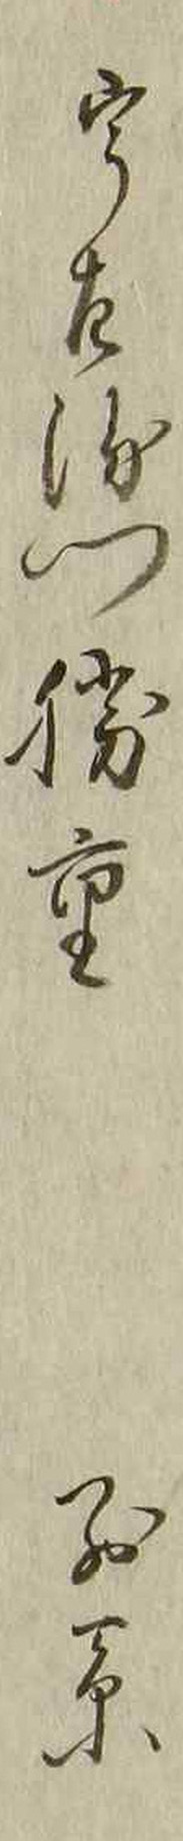宇左衛門勝重別系
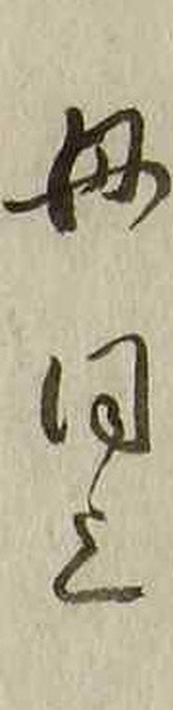母同上
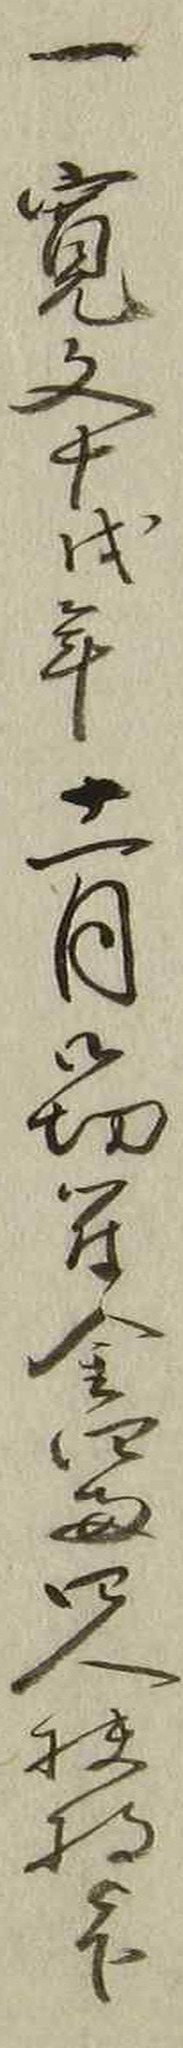一寛文十戌年十一月御切符金四両四人扶持被下
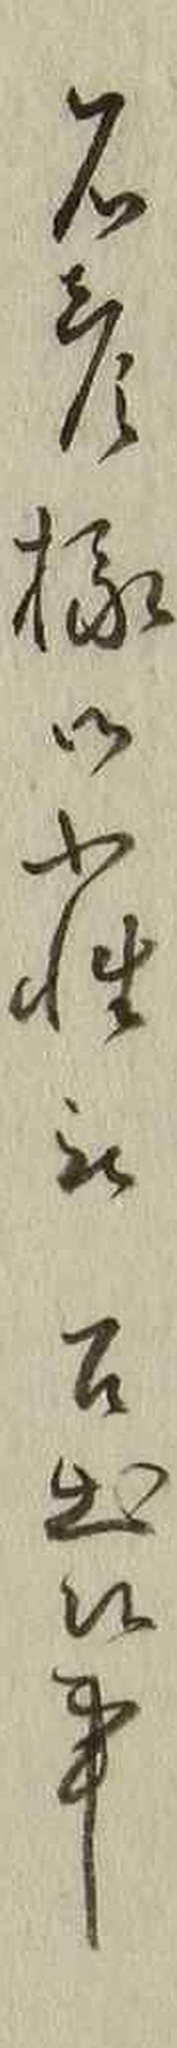石彦様御小性被召出候事
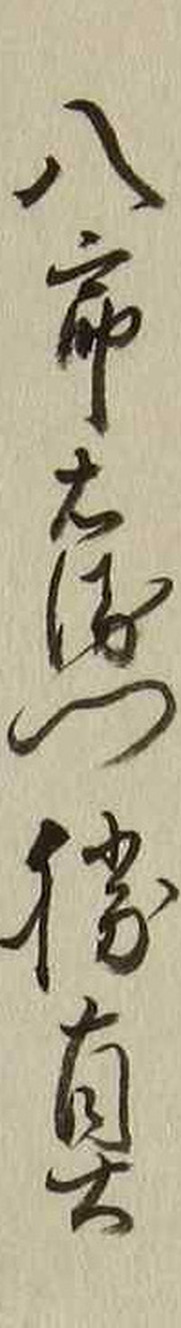八郎右衛門勝真
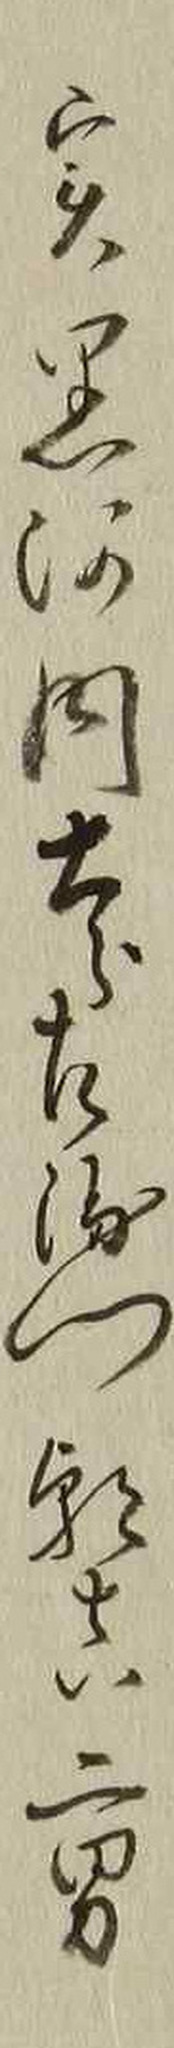実黒河内太郎左衛門朝真二男
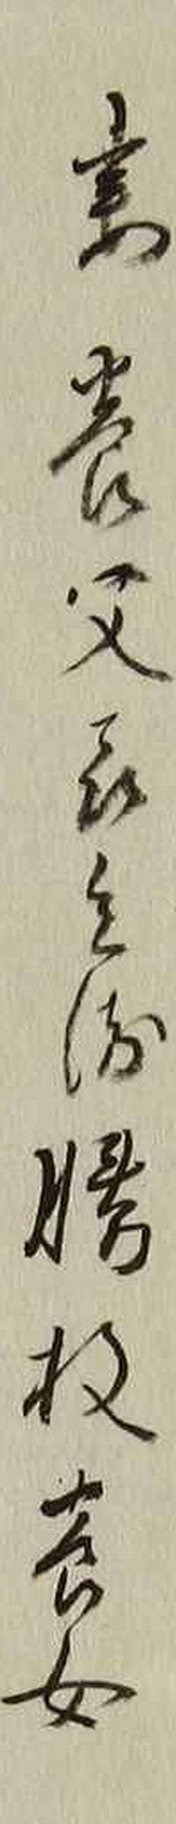妻養父喜兵衛勝枝養女
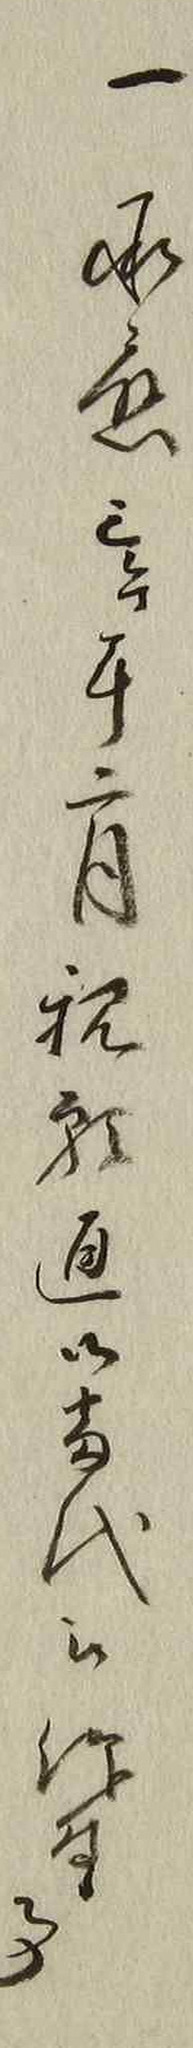一承応三午年二月親願通御番代被仰付候事
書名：諸士系譜　巻之6　い之部6
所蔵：会津若松市立会津図書館
